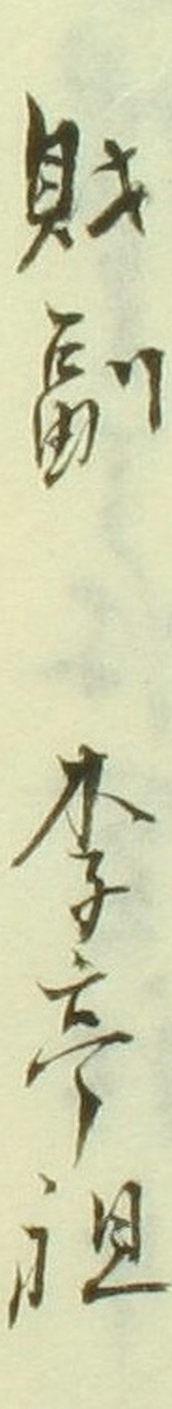財副李亭祖
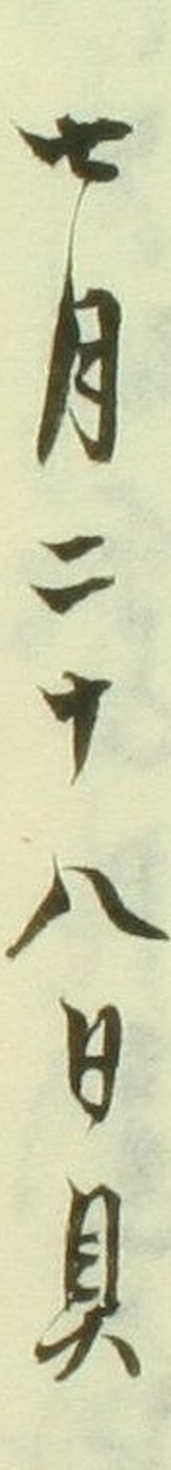七月二十八日具
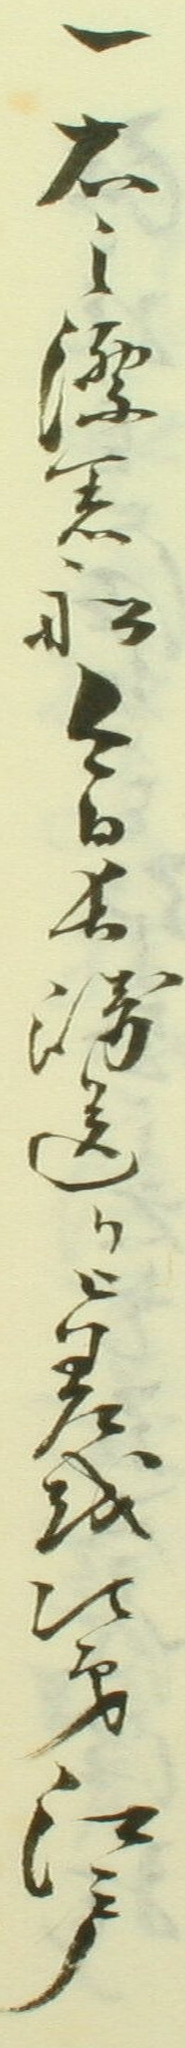一右之漂着船今日長崎送り被差越次第江戸
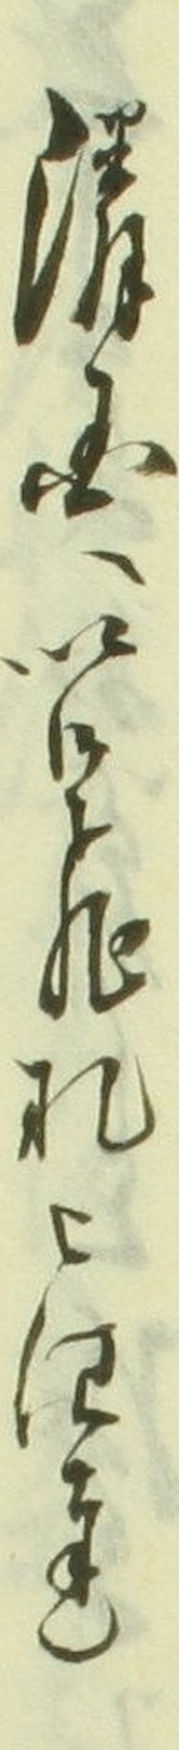清国へ以飛札被任達
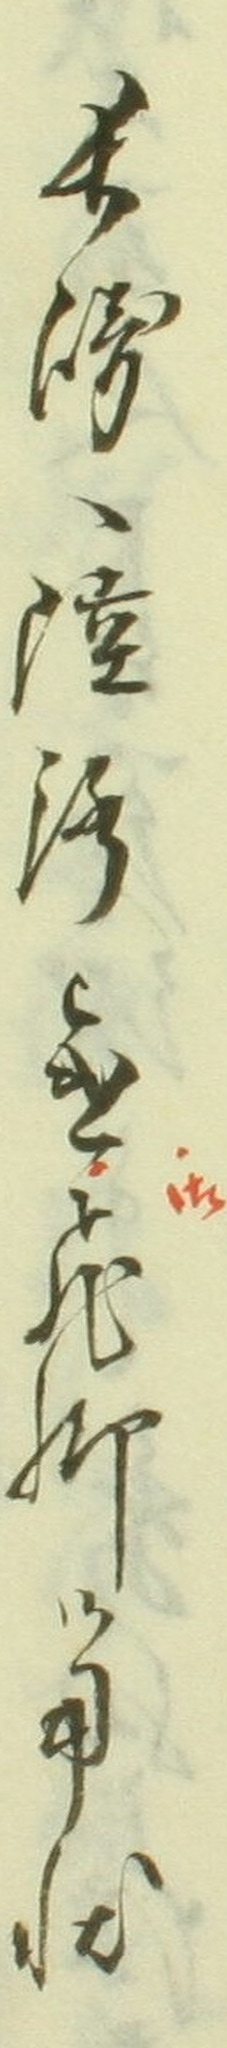長崎へ陸路被遣御飛脚御用状
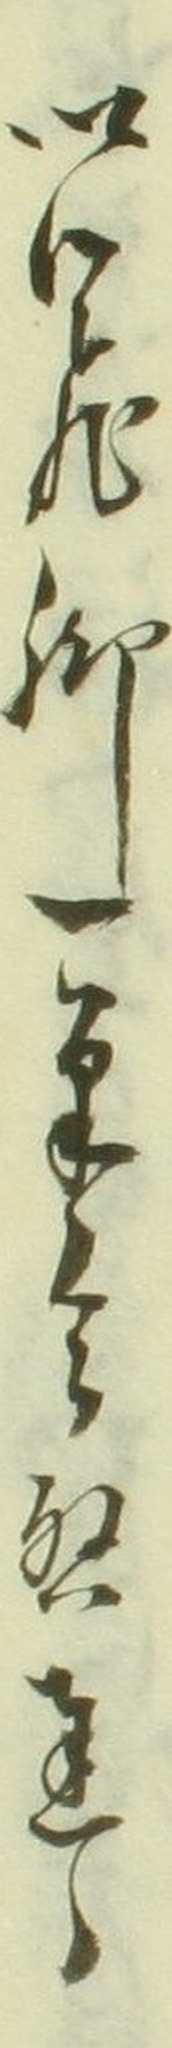以飛脚一筆令啓達候
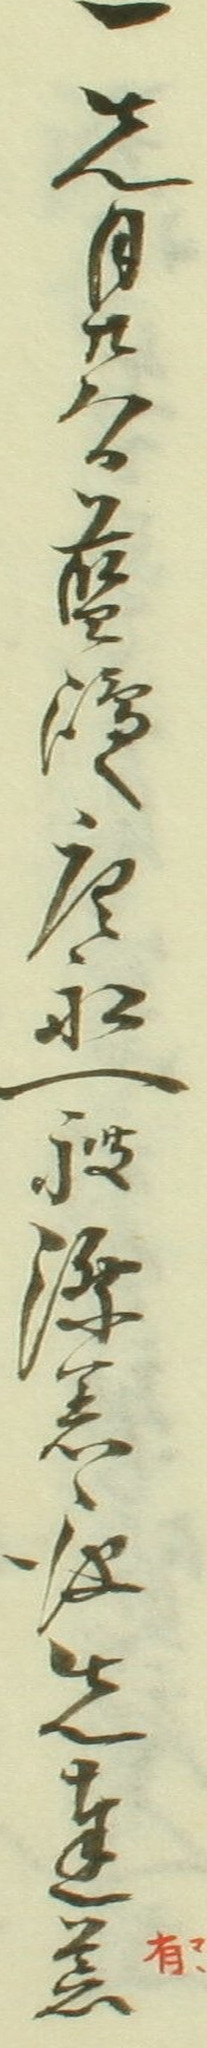一先月廿八日藍嶋へ唐船一艘漂着之儀先達着
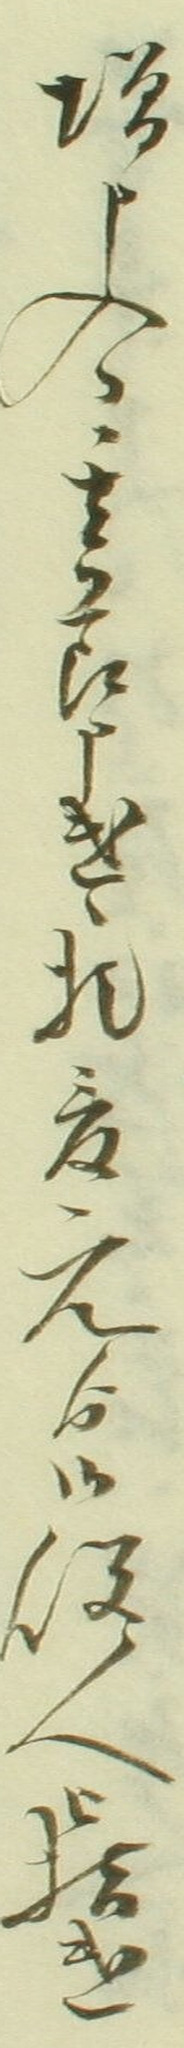増申入候其節申遣候様爰元ゟ御役人被指遣
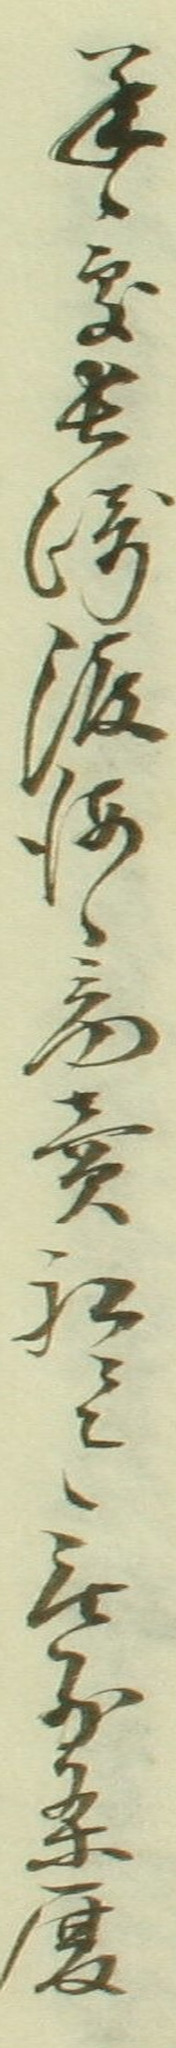承候処長崎渡海候商売船ニて候無別条厦
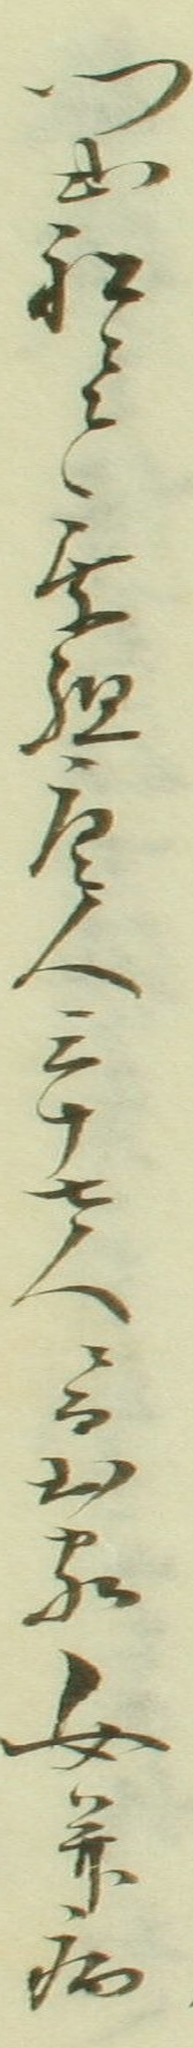門出船ニて候乗組唐人三十七人に而出家女并病
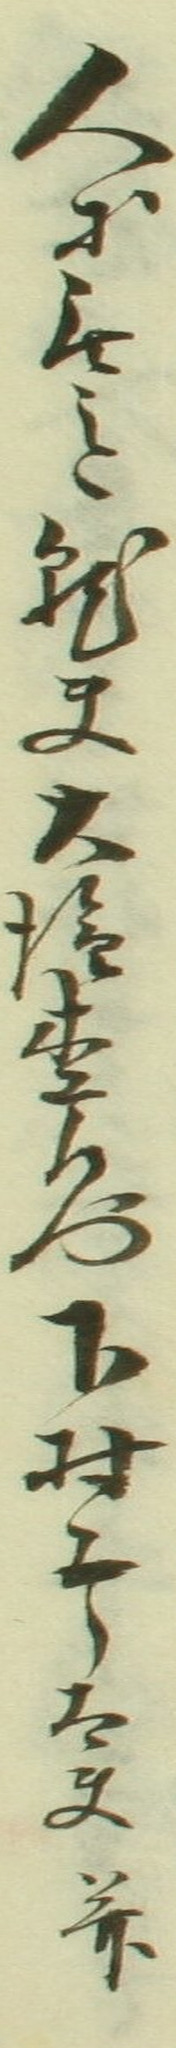人等無之候就夫大塩杢左衛門下村五郎太夫并
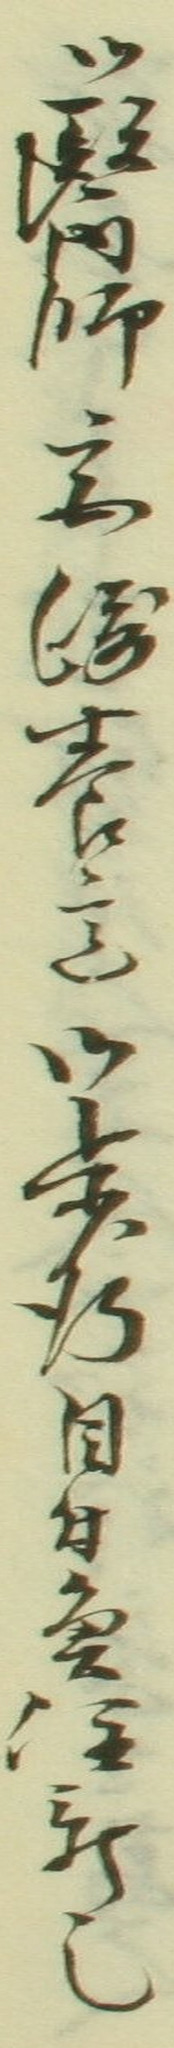御医師宮崎養意御歩行目付魚住新兵衛

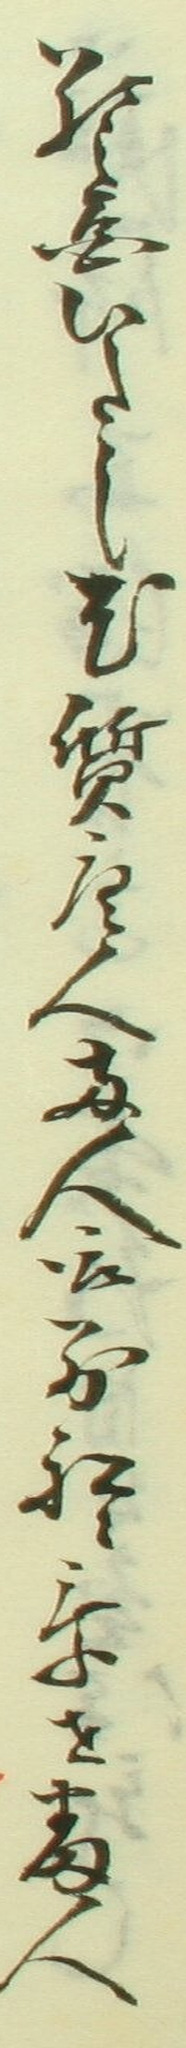警固いたし尤質唐人両人取別船ニ乗せ番人
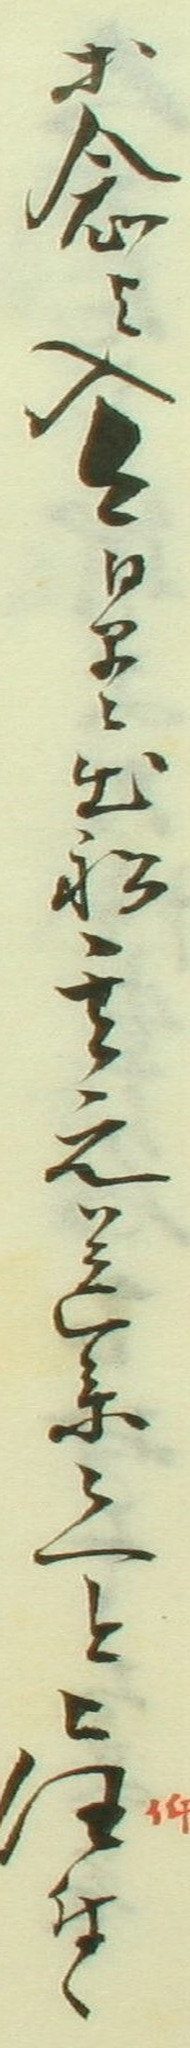等念と入今日早々出船其元送参候へと被任付候
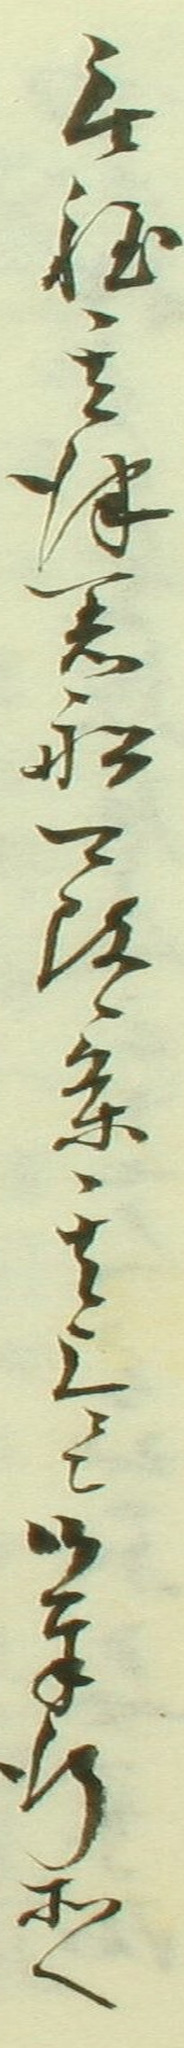無程其津着船可改候条其上ニて御奉行所へ
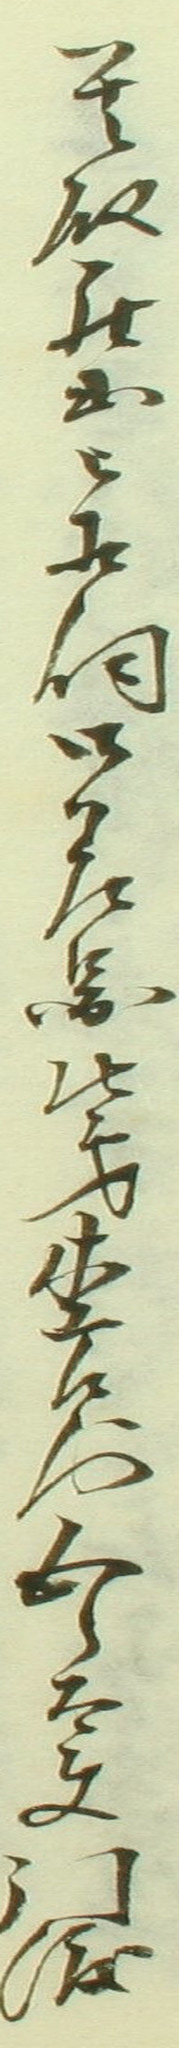貴殿罷出被相伺御指図次第杢左衛門五郎太夫引渡
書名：異国船漂着記
